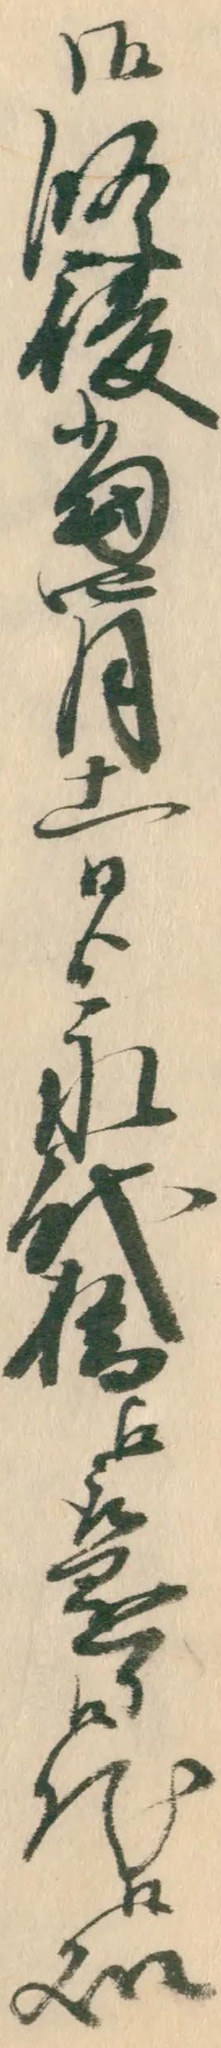御修復当四月十一日ゟ永代橋え取懸り候然ル処
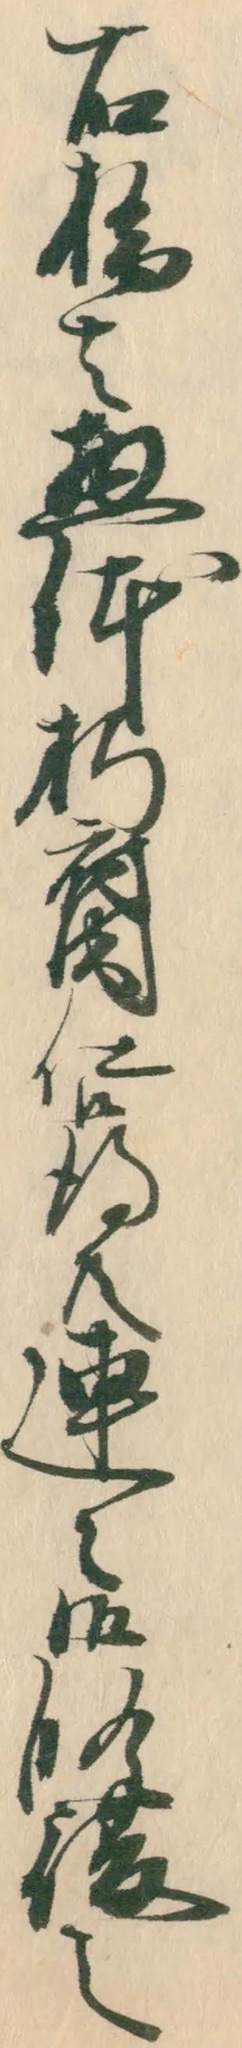右橋は惣体朽腐仕候得共連々御修復之

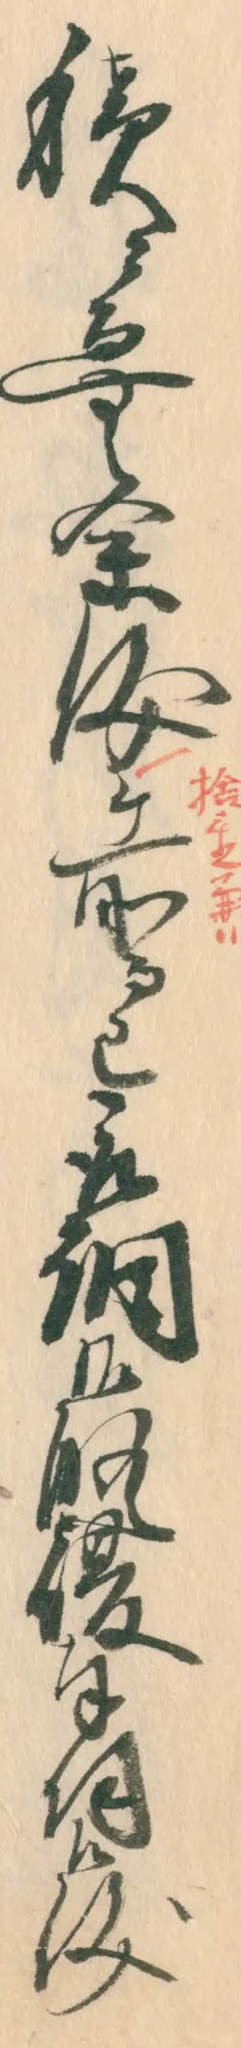積ニ而無余儀ケ所而已取調御修復奉伺候儀
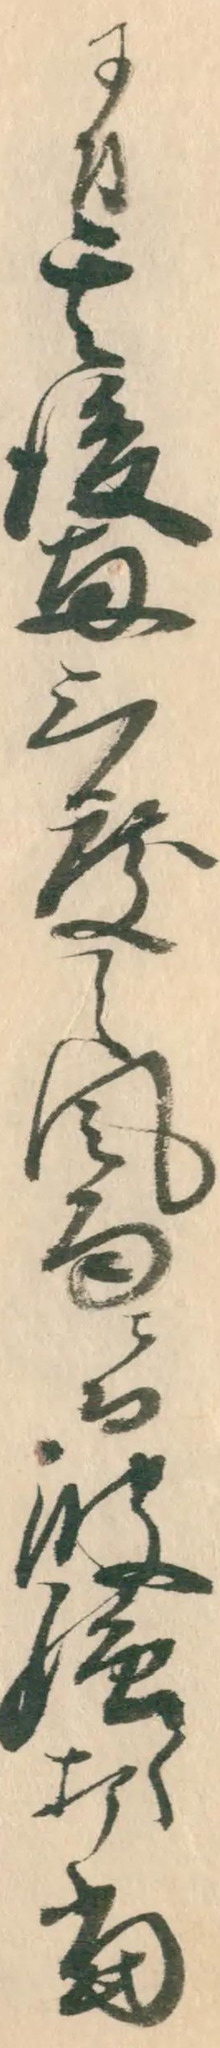に付其後両三度之風雨ニ而波強く打当
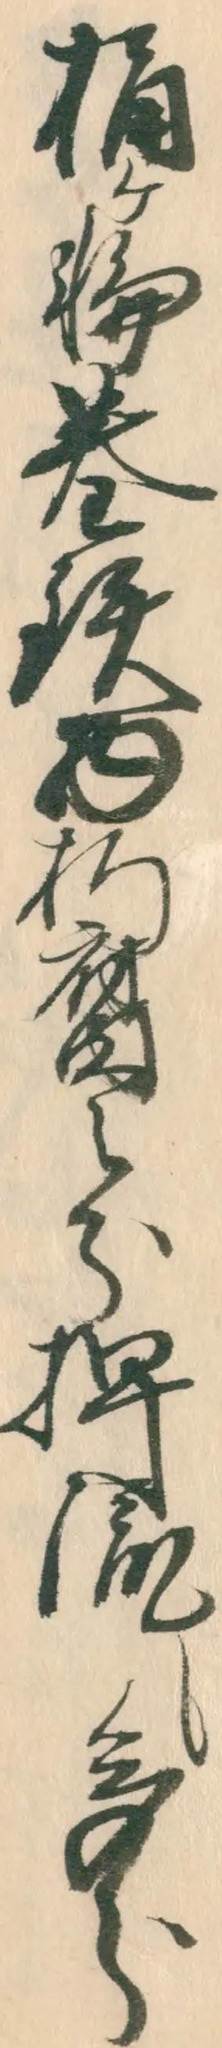桶ケ輪巻鉄物朽腐之分押流し多分
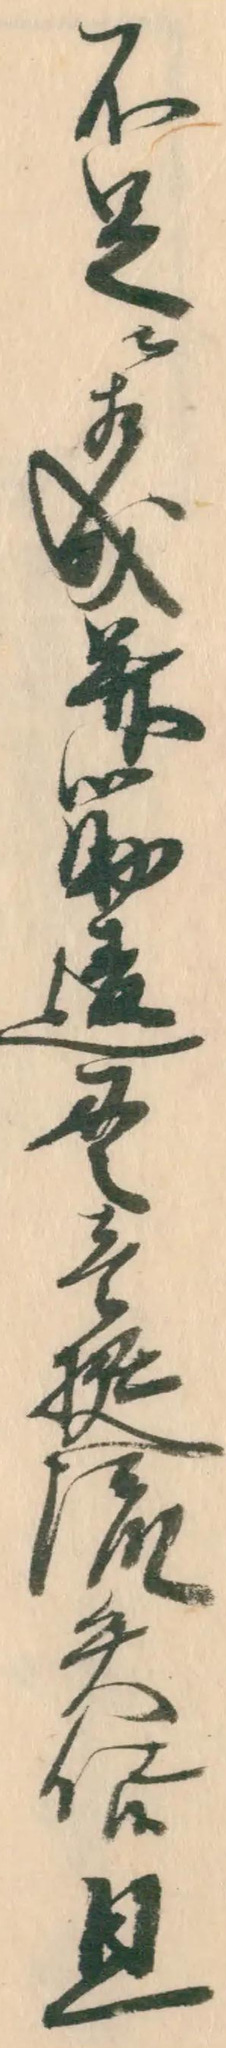不足ニ相成并筋違貫壱挺流失仕候且
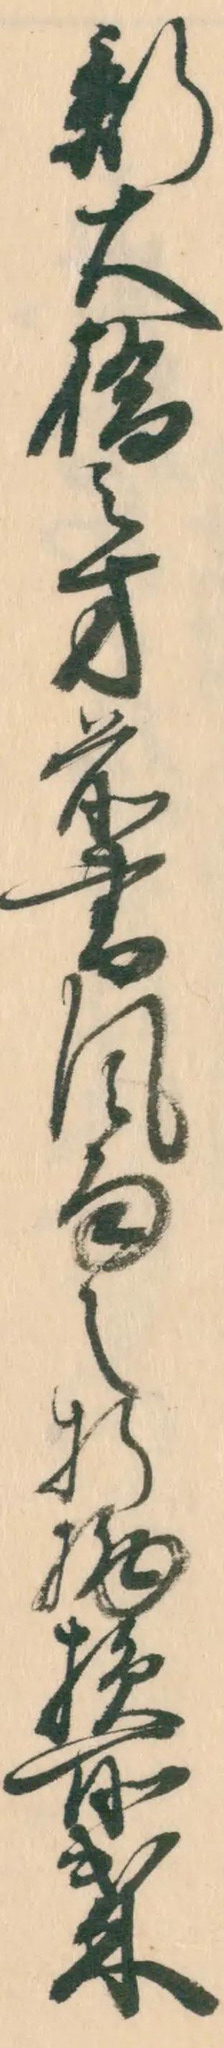新大橋之方前書風雨之折柄損所出来
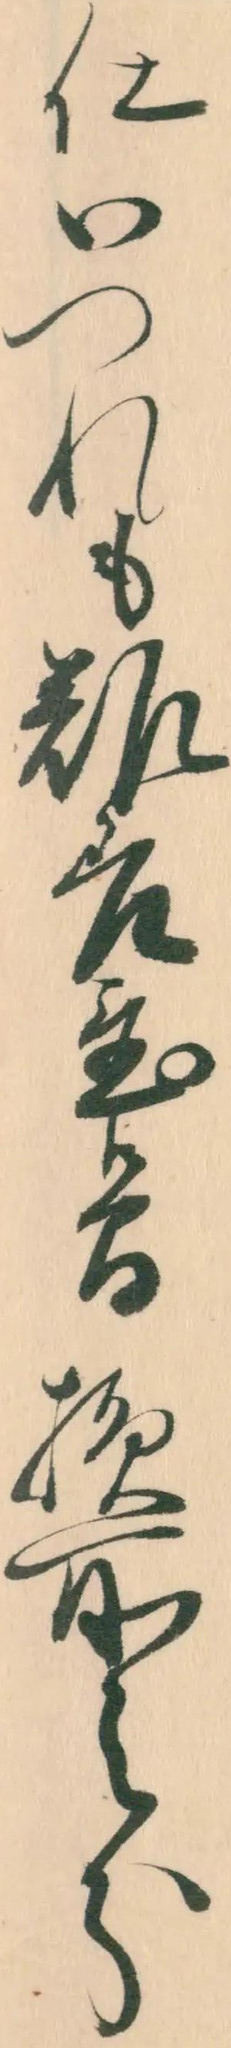仕いつれも難差置候間損所之分
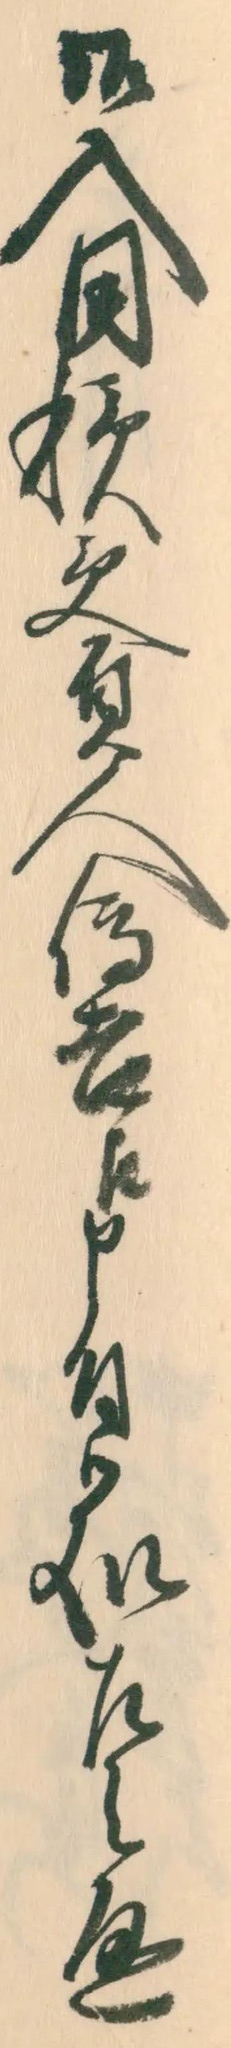御入用積受負人伝吉え申付候処左之通
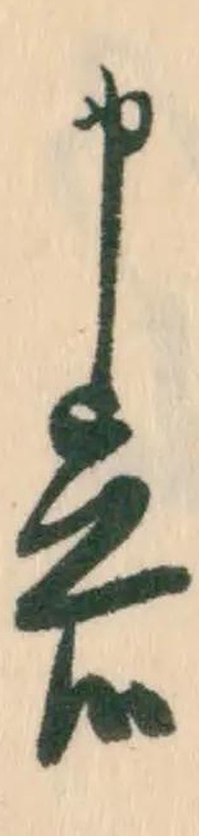申立候
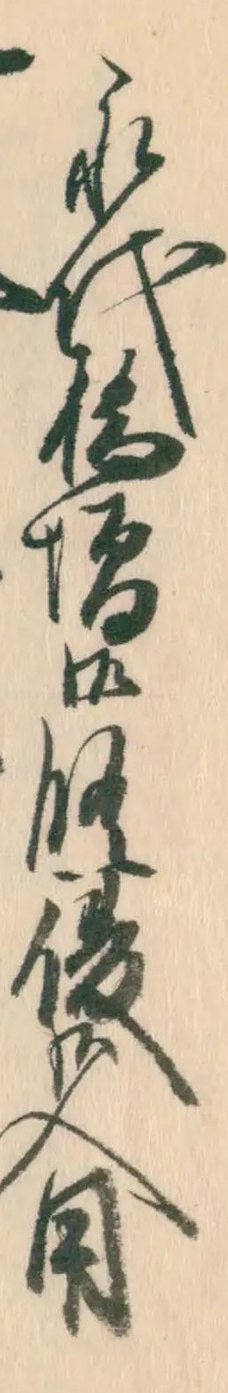永代橋増御修復御入用
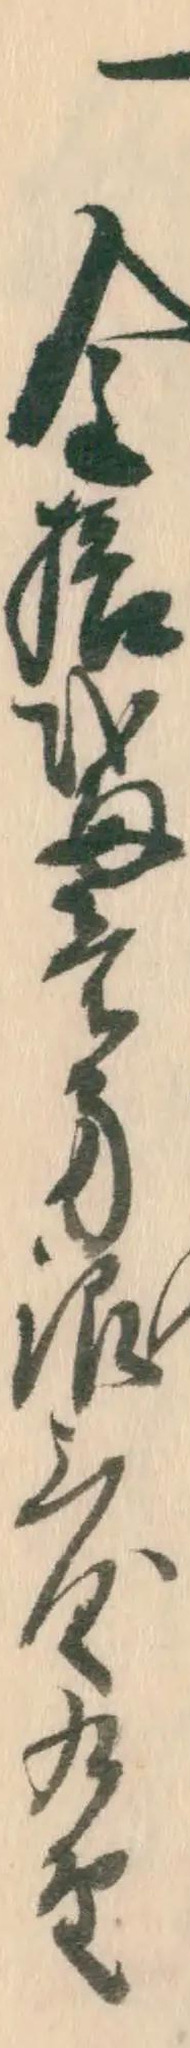一金拾弐両壱分銀三匁九厘
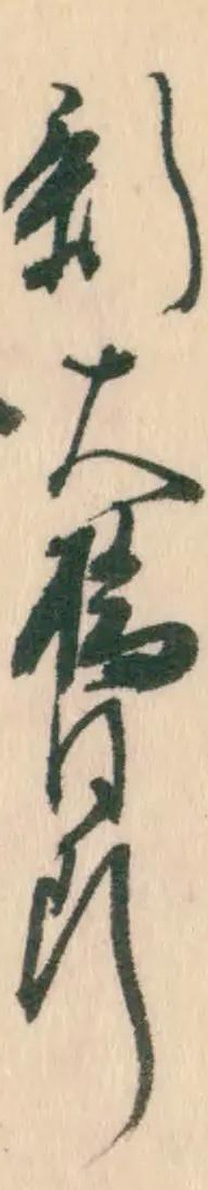新大橋同断
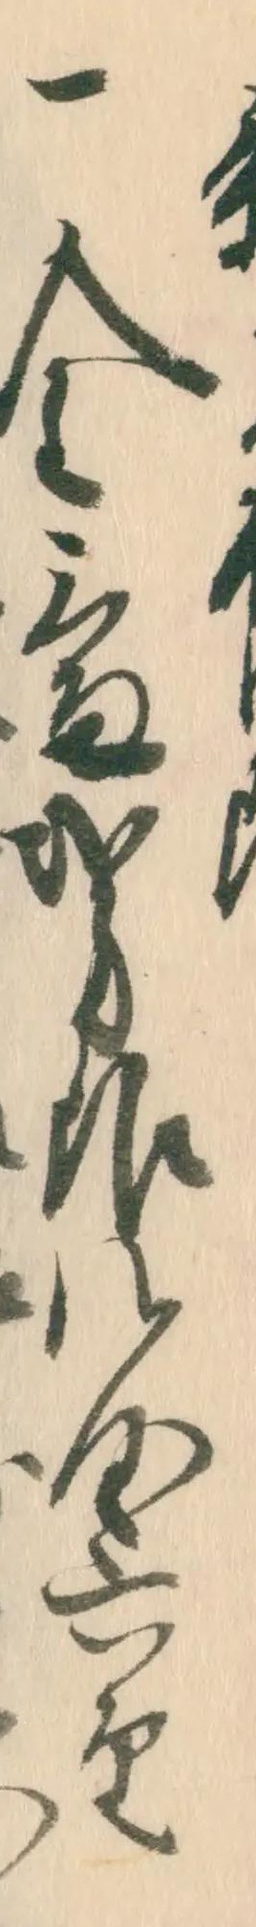一金三両弐分銀八匁六厘
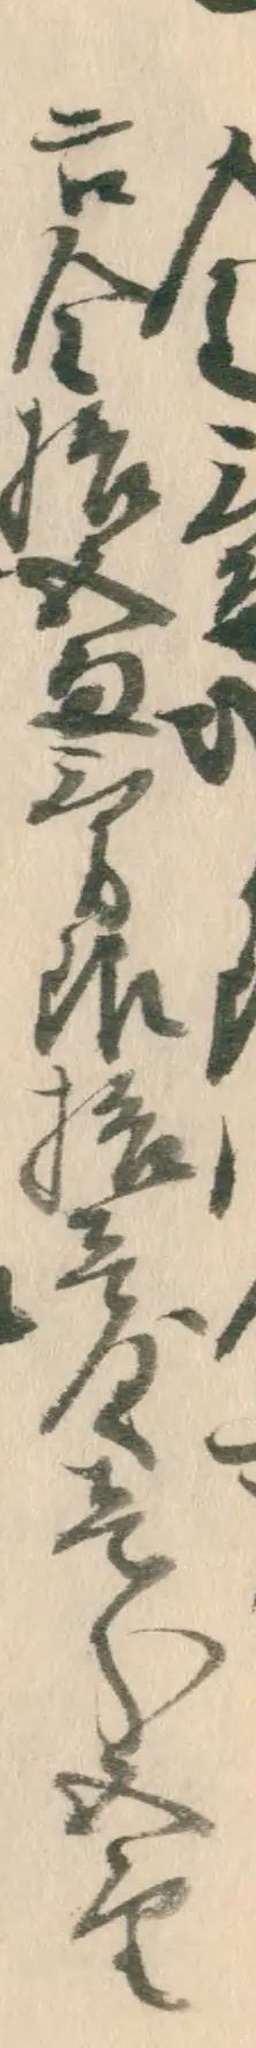二口金拾五両三分銀拾壱匁壱分五厘
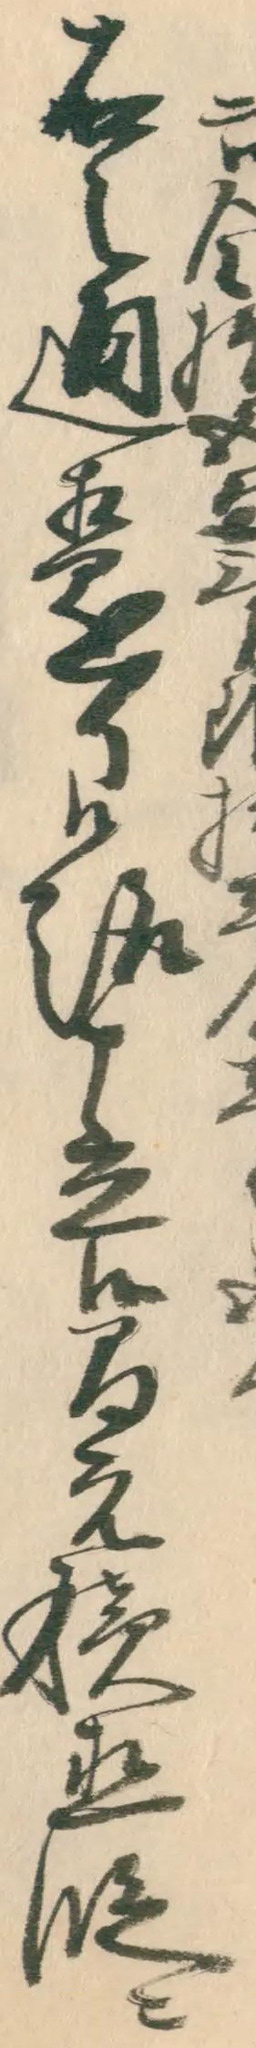右之通相懸り候趣申立候間元積直段ニ
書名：三橋 17巻. [8] 三橋小破御修復書留　但御奉行御掛リ替地震潰橋番屋　嘉永四亥年より安政二卯年迄　下
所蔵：国立国会図書館 National Diet Library, JAPAN
